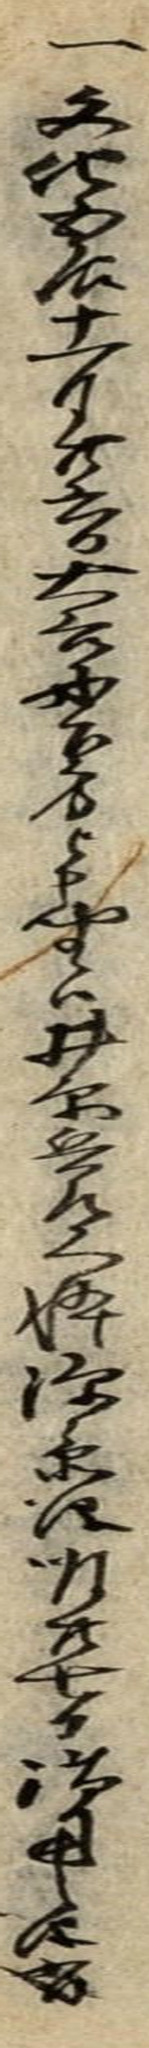一文化五辰十一月廿六日大谷丹下方被申聞候は井原兵左衛門忰源兵衛儀明廿七日御用之儀
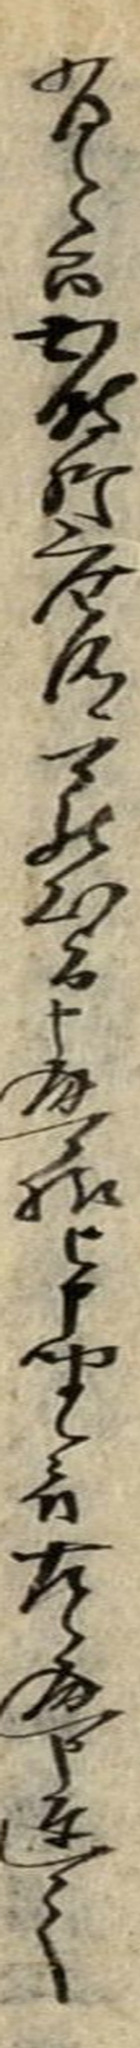有之候間五時御座所へ可罷出候旨申通候様被申聞候に付左之通申達之
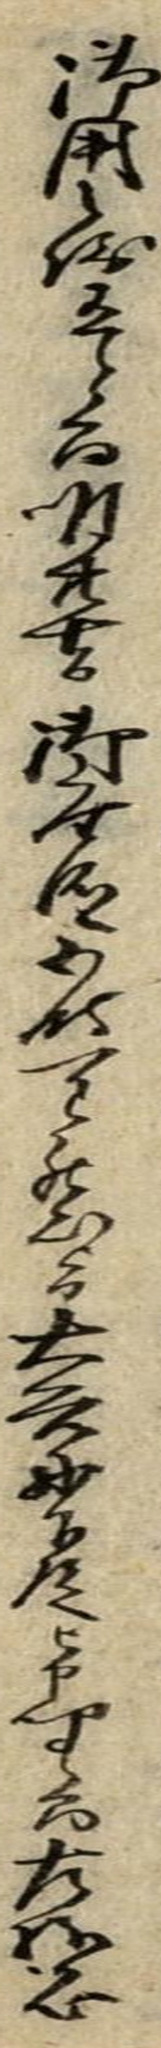御用之儀有之候間明廿七日御座所へ五時可被罷出旨大谷丹下殿被申聞候間左様御心
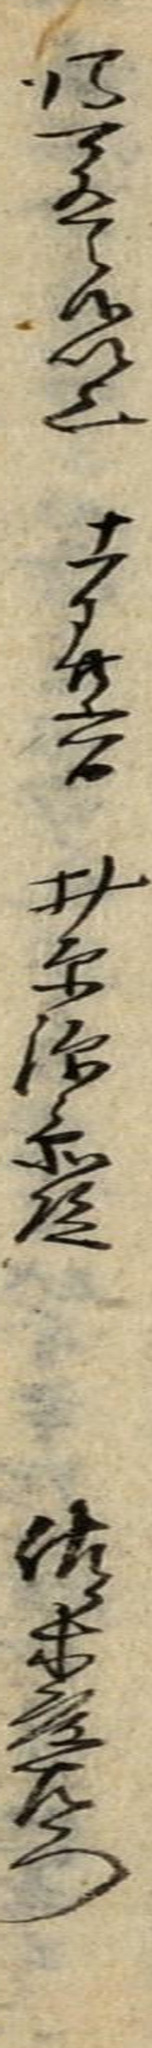得可有之候以上十一月廿六日井原源兵衛殿佐々木藤左衛門
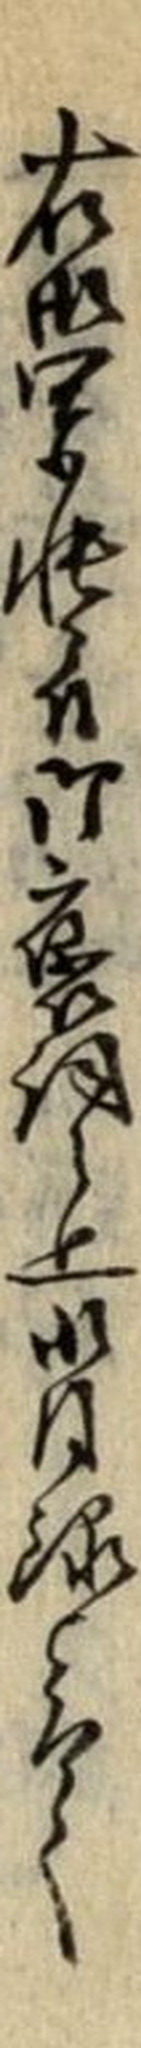右御軍帳に付御褒詞之上御目録被下之
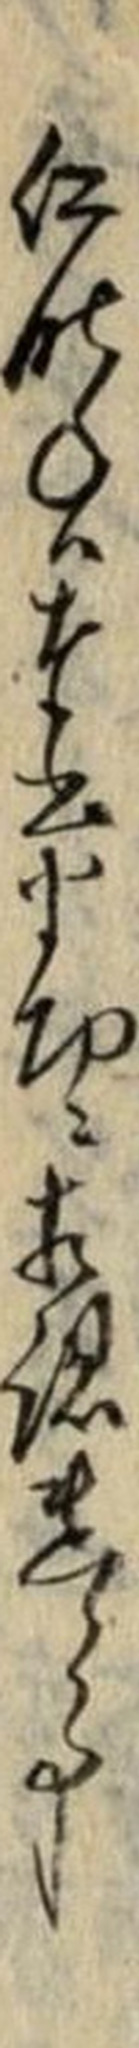但昨年は奉書半切に相認遣候事
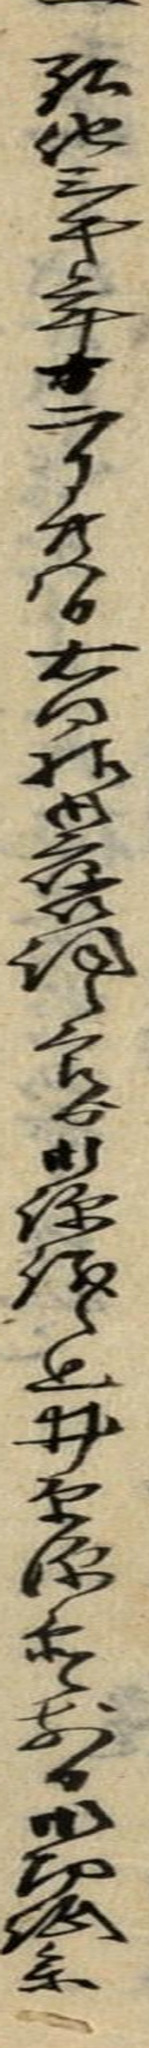一弘化三午年十二月廿八日右同様御褒詞之節ゟ御評議之上井原源兵衛へ前日御切紙参
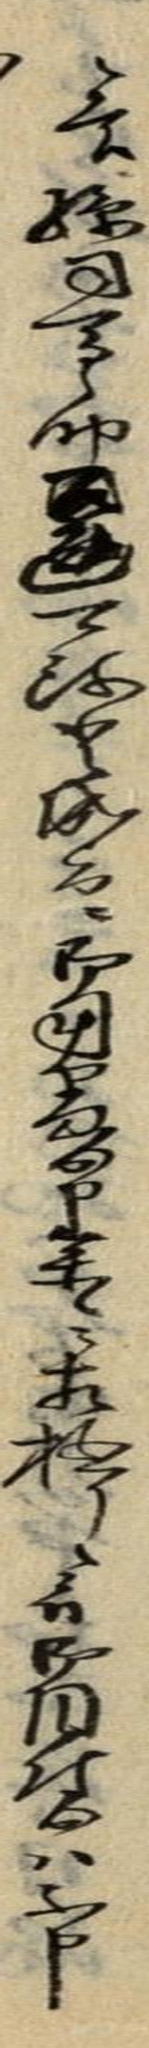候節孫司馬之助召連可致登城旨に御用番ゟ申参候に相極り候に付御目付ゟは不申
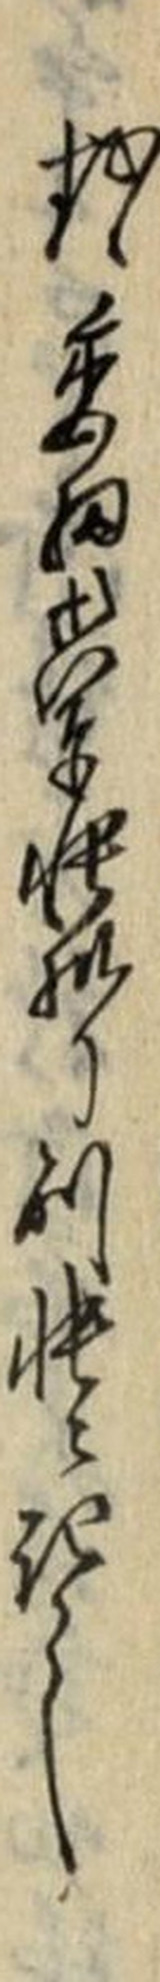越候委細御軍帳掛り別帳に記之
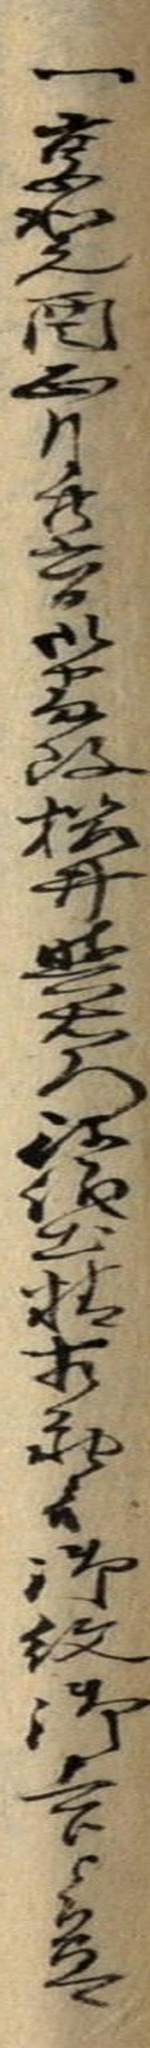一享和元酉正月廿六日御番改桜井与右衛門役儀出精相勤候付御紋御上下被下置候
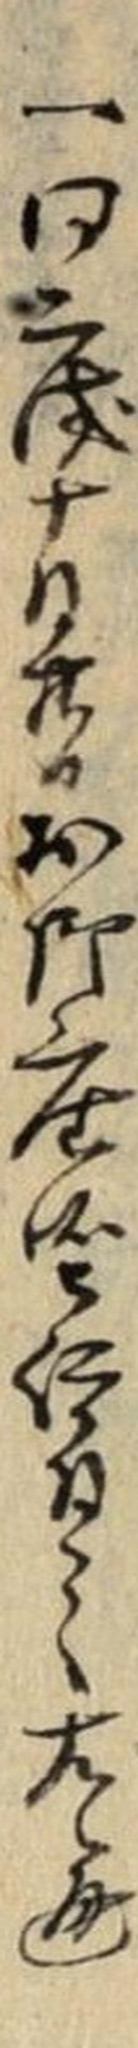一同二戌十月廿日於御座所被仰付之左之通御奉行
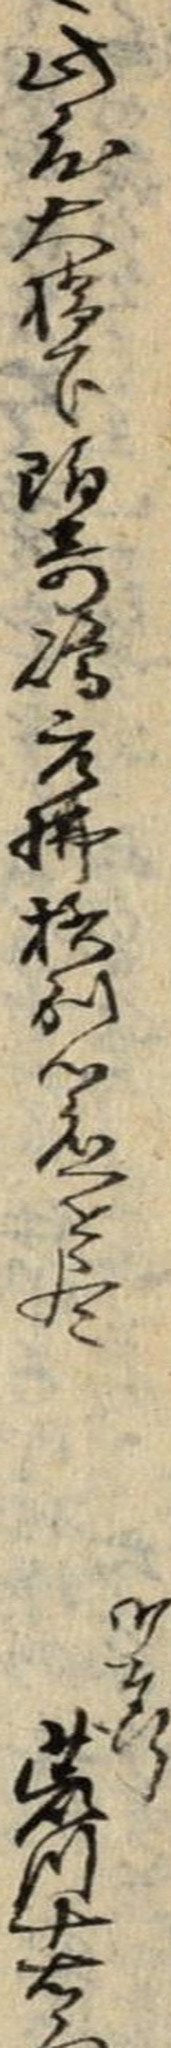此度大橋下附寄嶋取払格別心底を尽荒川十右衛門
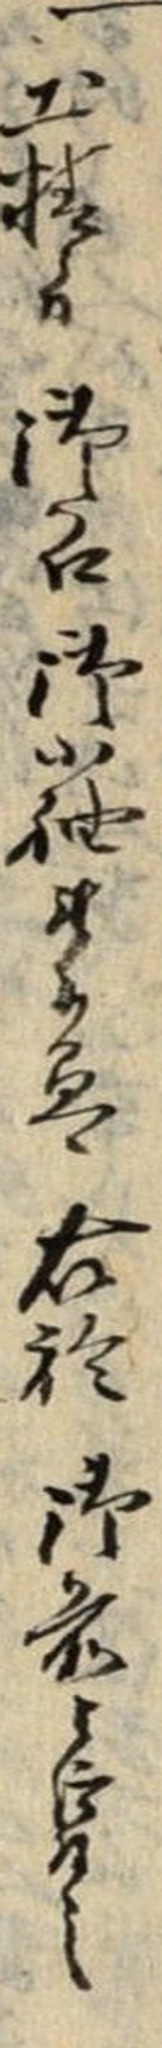出精に付御召御小袖被下置候右於御前被仰付之
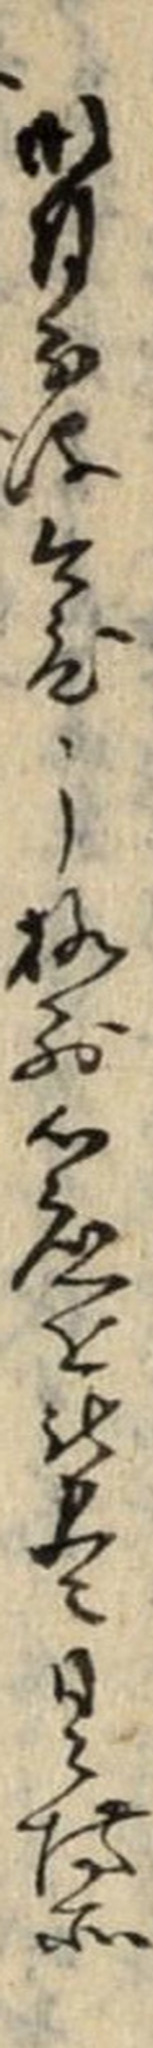御自分儀今度之格別心底を被尽日々場所右同人
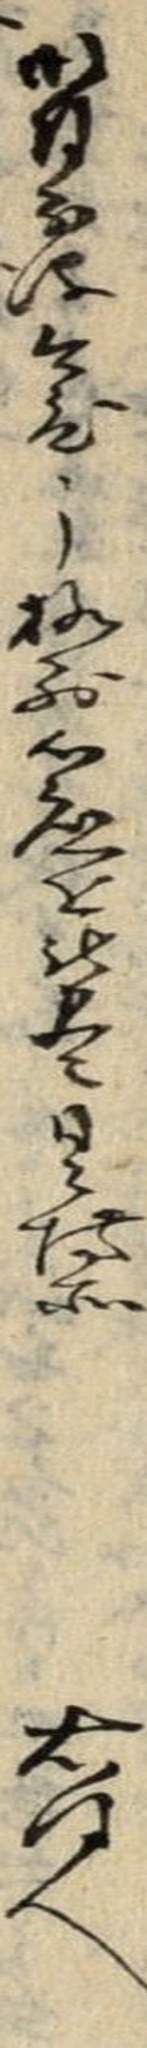御自分儀今度之格別心底を被尽日々場所右同人
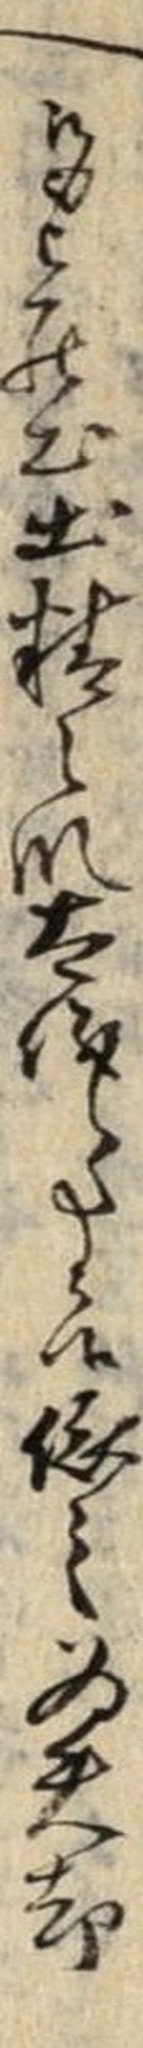江も被罷出出精之段大儀之事に候依之為夫却
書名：御用并被仰出之部
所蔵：福井県文書館 Fukui Prefectural Archives
